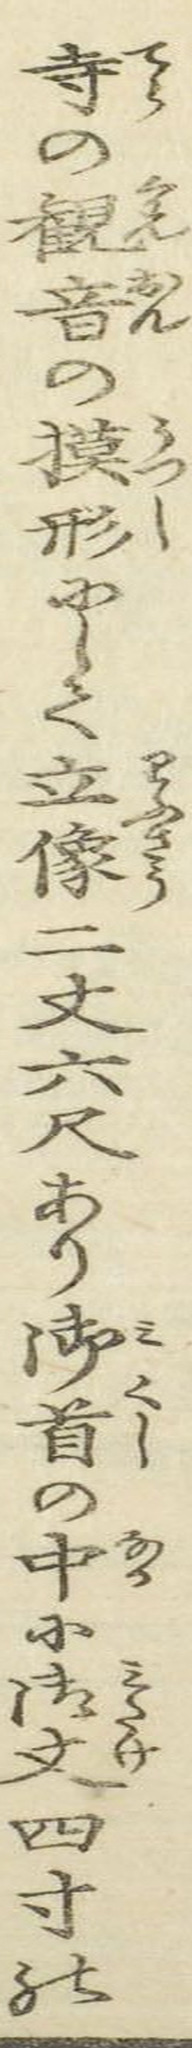寺の観音の摸形にして立像二丈六尺あり御首の中に御丈四寸の
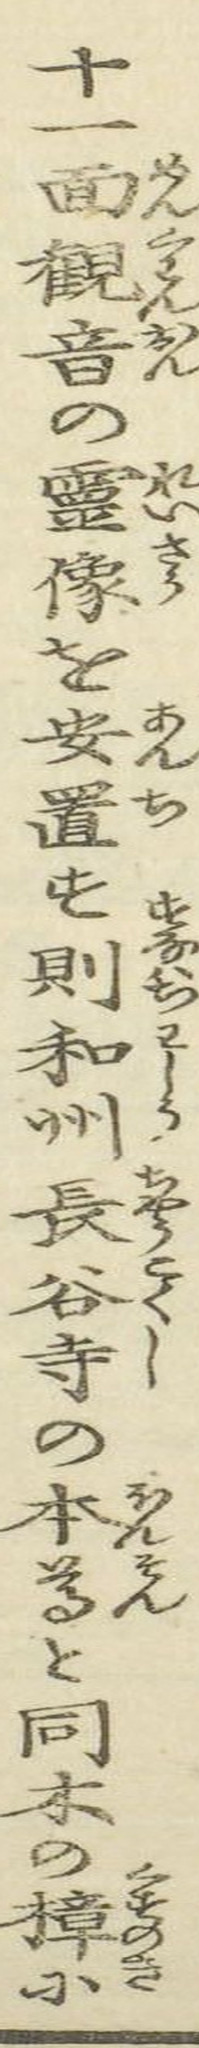十一面観音の霊像を安置す則和州長谷寺の本尊と同木の樟に
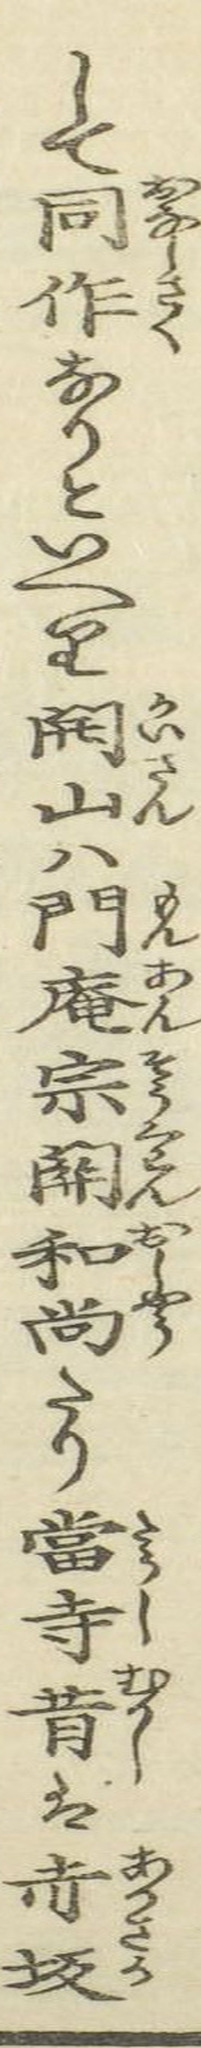して同作なりといへり開山は門庵宗關和尚たり當寺昔は赤坂
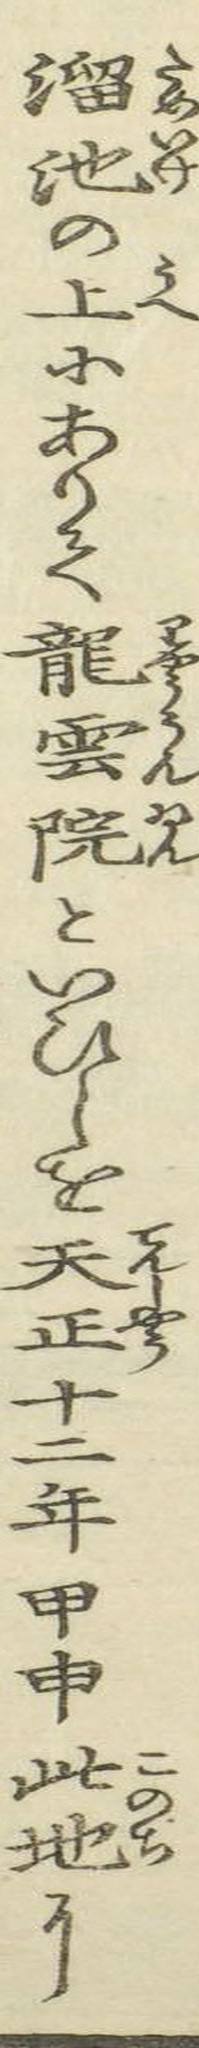溜池の上にありて龍雲院といひしを天正十二年甲申此地に
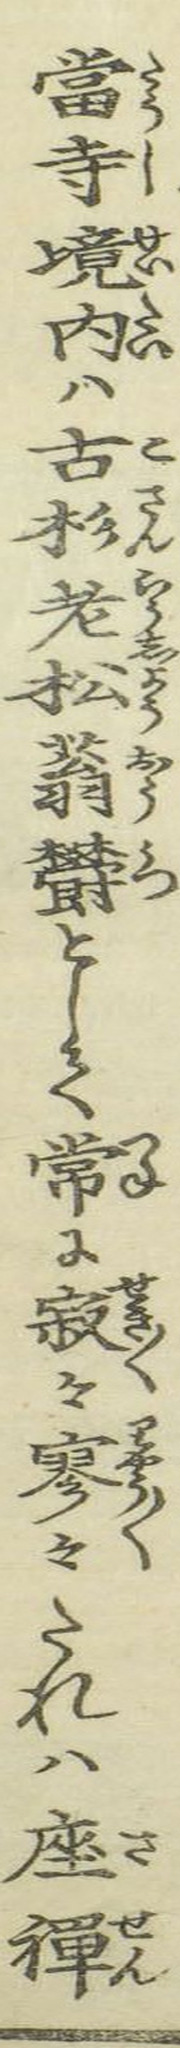當寺境内は古杉老松蓊欝として常に寂々寥々たれは座禪

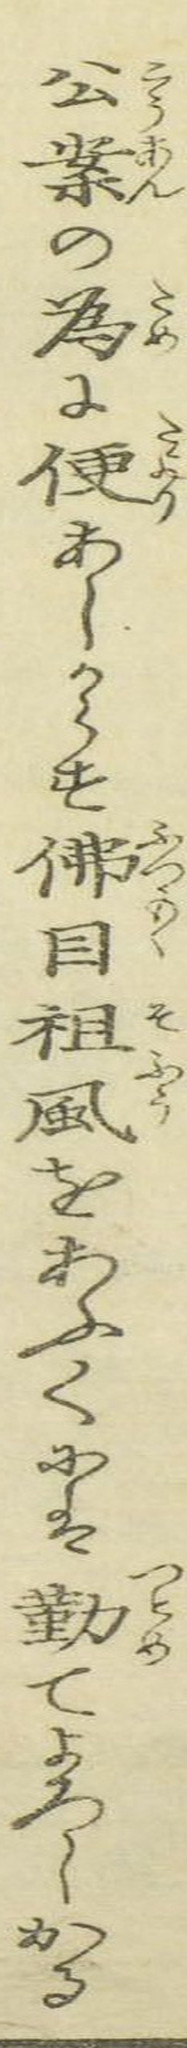公案の為に便あしからす佛目祖風をあふくには勤よろしかる
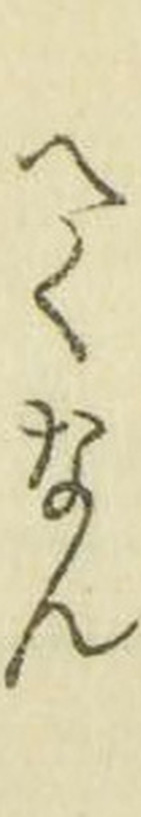へくなん
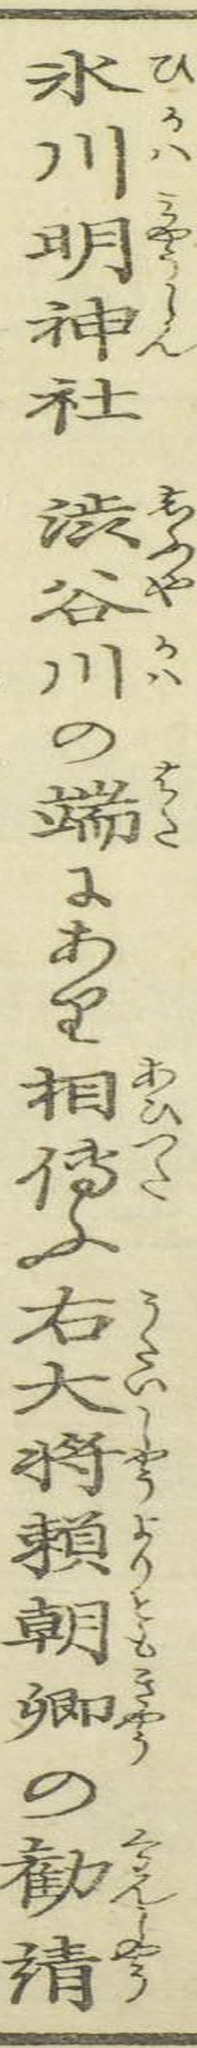氷川明神社渋谷川の端にあり相傳ふ右大将頼朝卿の勧請
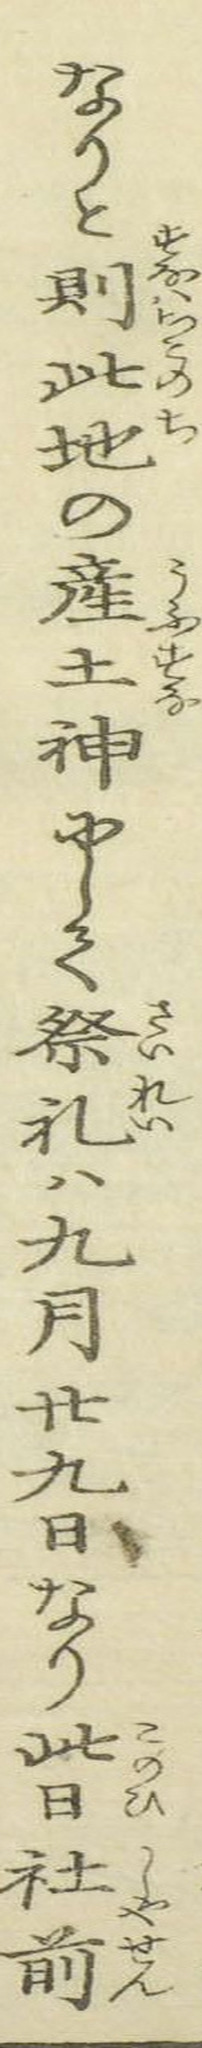なりと則此地の産土神にして祭礼は九月廿九日なり此日社前
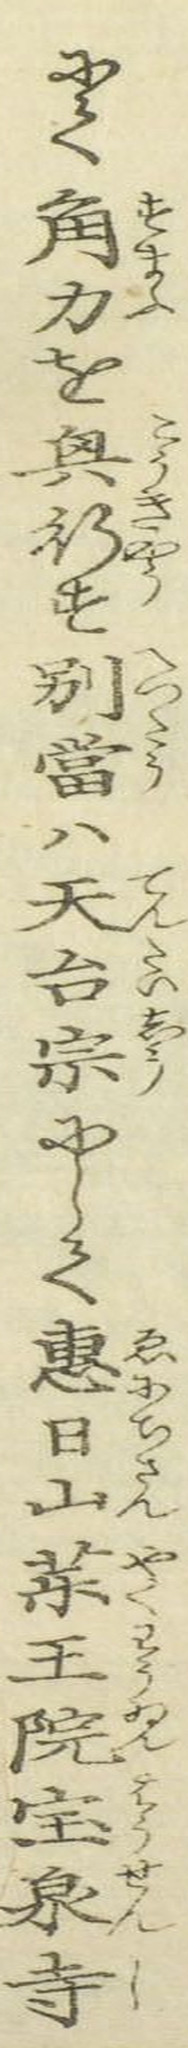にて角力を興行す別當は天台宗にして惠日山薬王院宝泉寺
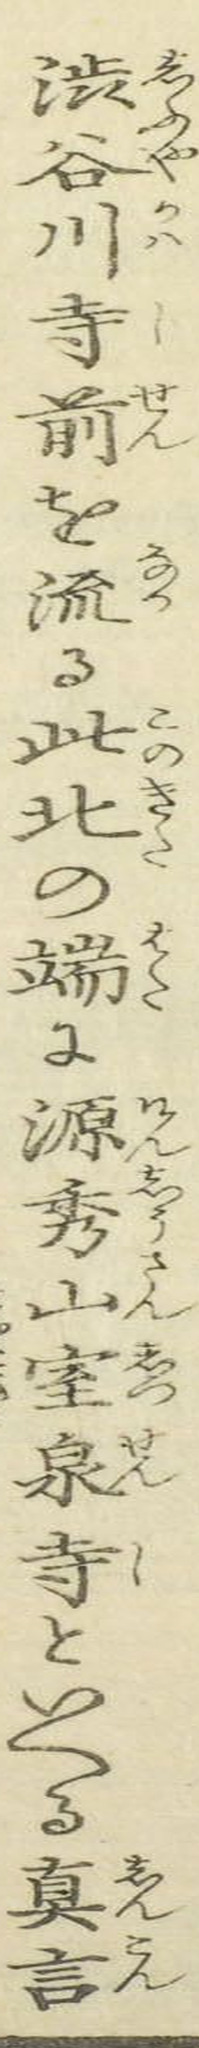渋谷川寺前を流る此北の端に源秀山室泉寺といへる真言
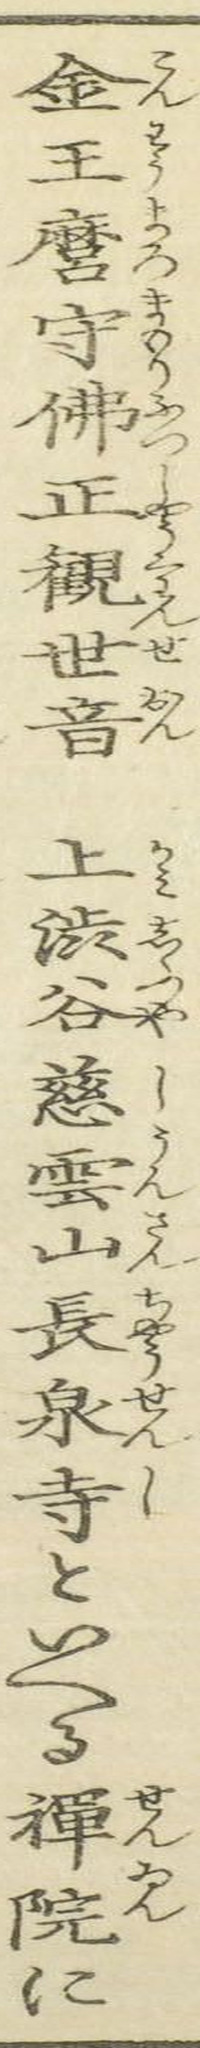金王麿守佛正観世音上渋谷慈雲山長泉寺といへる禪院に
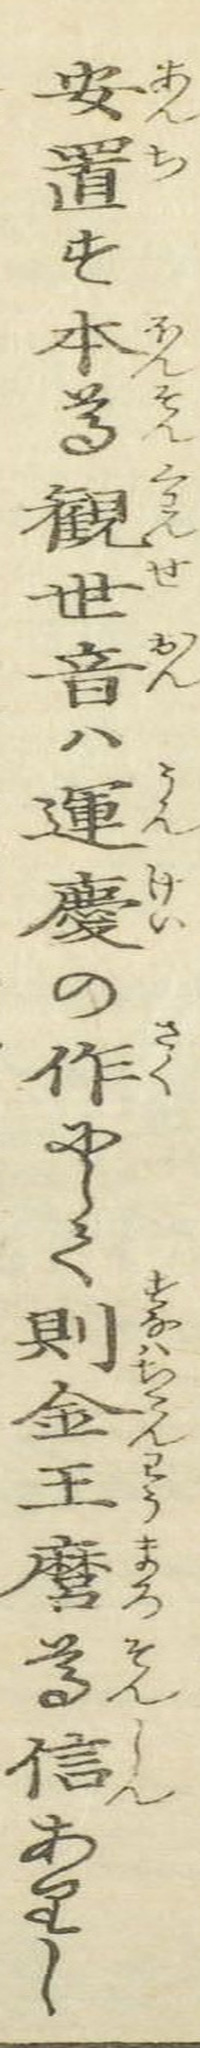安置す本尊観世音は運慶の作にして則金王麿尊信ありし
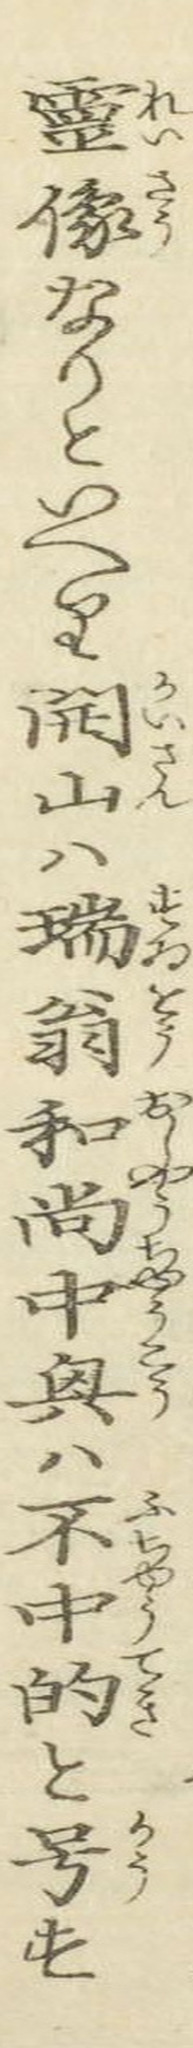霊像なりといへり開山は瑞翁和尚中興は不中的と号す
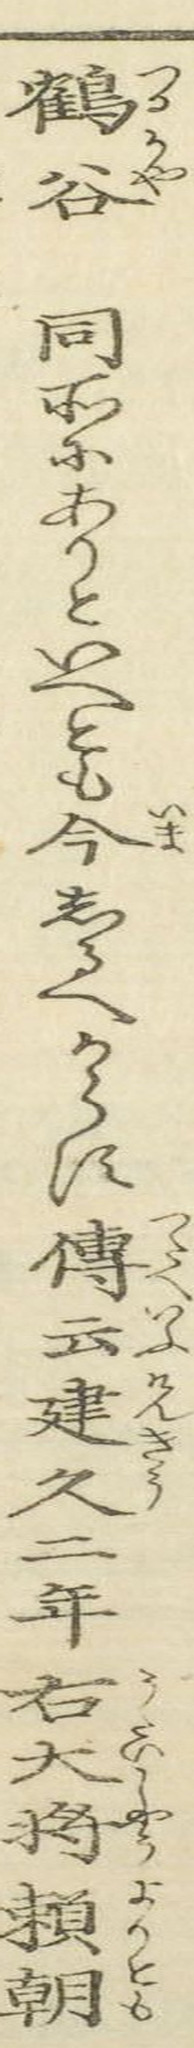鶴谷同所にありといへとも今しるへからす傳云建久二年右大将頼朝
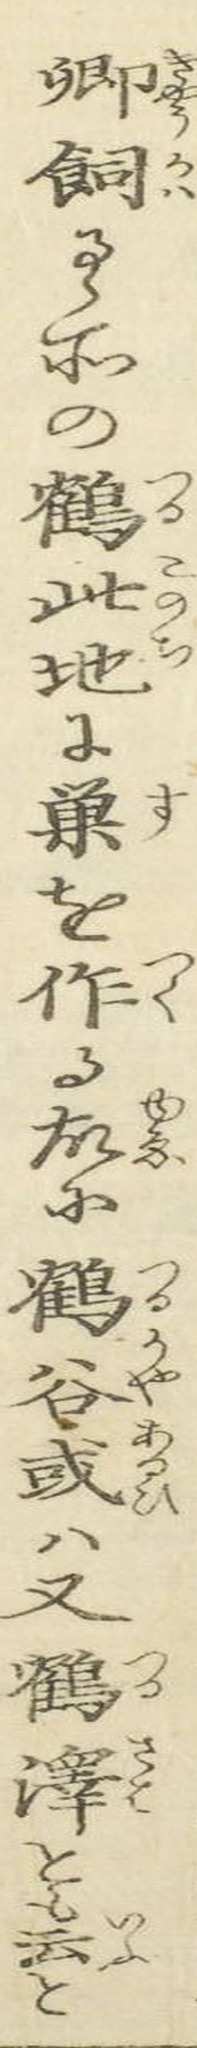卿飼るゝ所の鶴此地に巣を作る故に鶴谷或は又鶴澤とも云と
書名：江戸名所図会 20巻 巻之8
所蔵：東京学芸大学教育コンテンツアーカイブ
